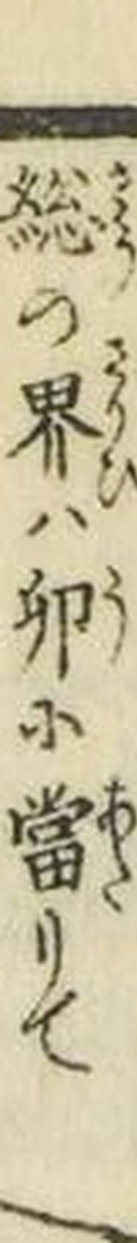総の界は卯に當りて
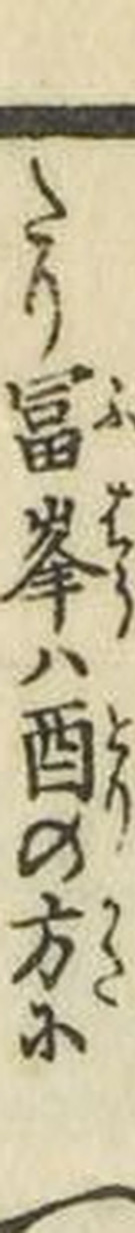たり冨峯は酉の方に
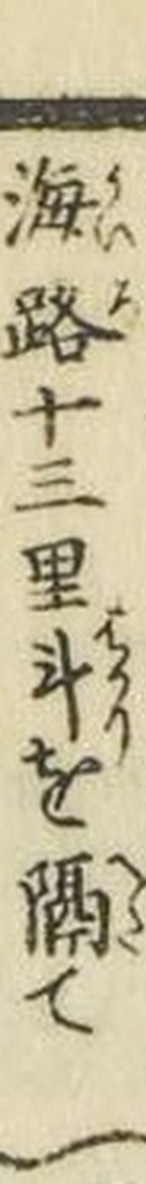海路十三里斗を隔て
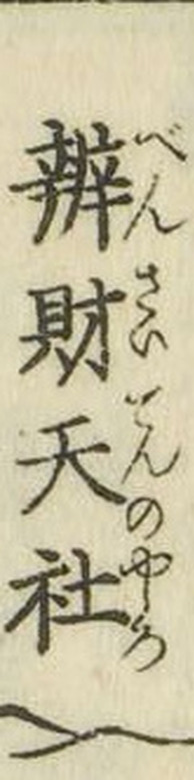辨財天社

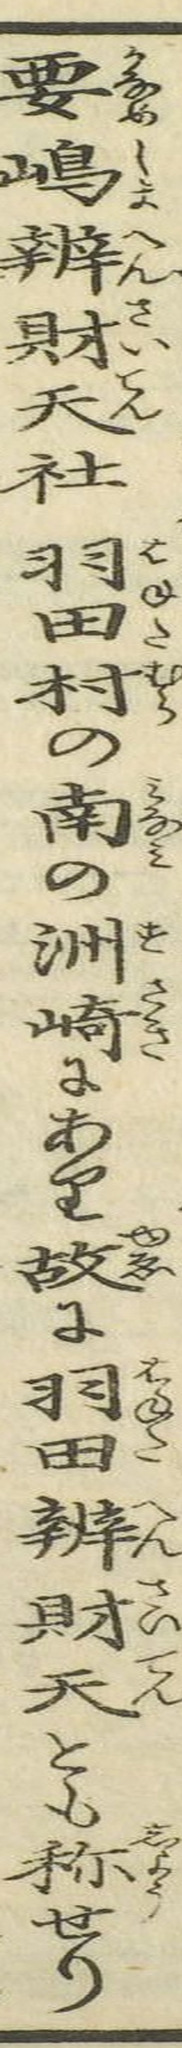要嶋辨財天社羽田村の南の州崎にあり故に羽田辨財天とも称せり
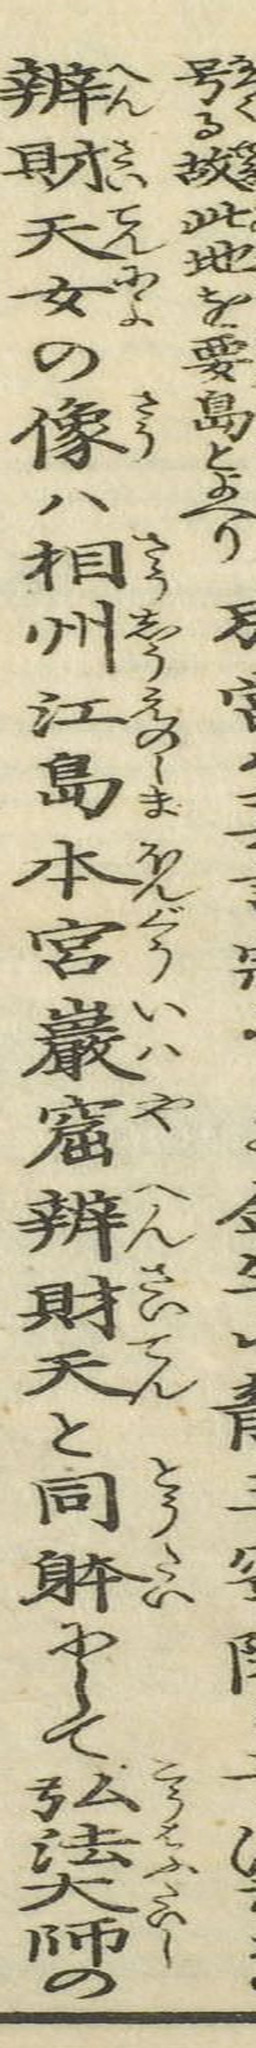辨財天女の像は相州江島本宮巖窟辨財天と同躰にして弘法大師の
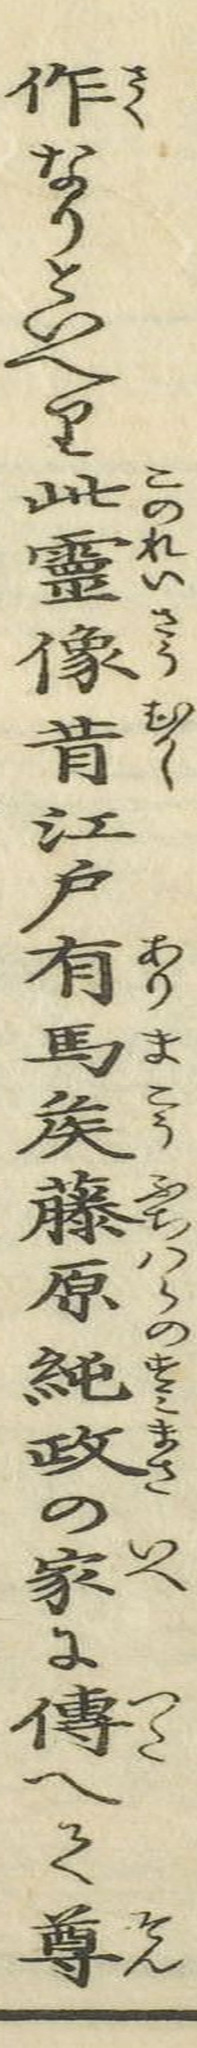作なりといへり此靈像昔江戸有馬矦藤原純政の家に傳へて尊
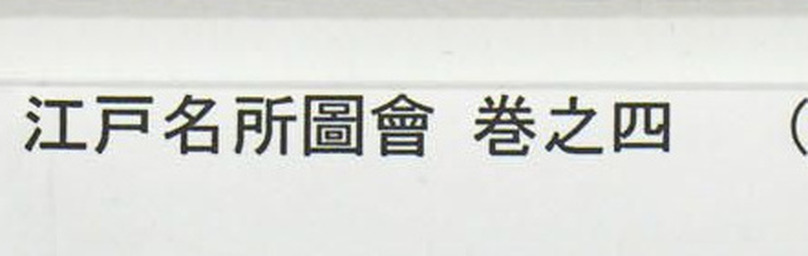江戸名所圖會天璇之巻
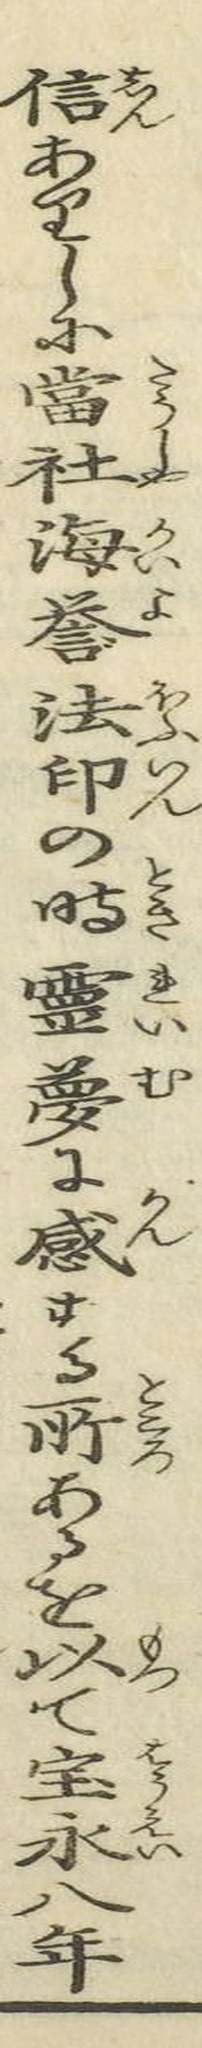信ありしに當社海誉法印の時靈夢に感する所あるを以て宝永八年
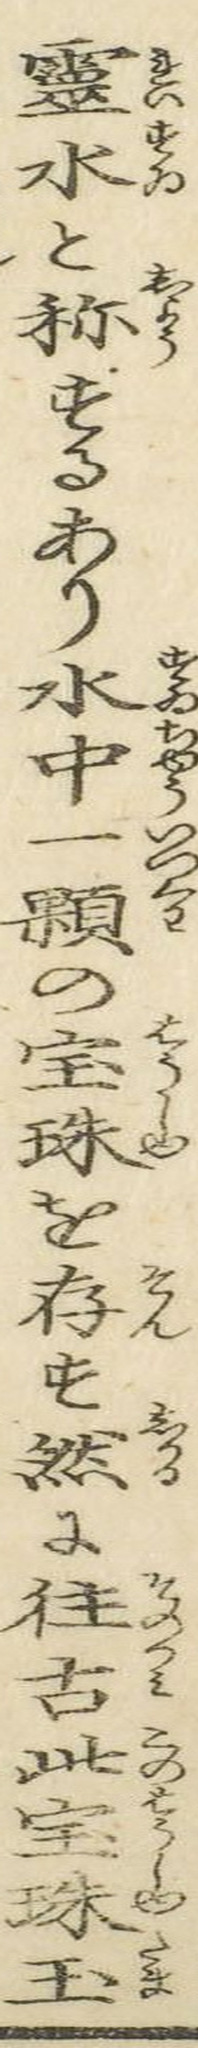靈水と称するあり水中一顆の宝珠を存す然に往古此宝珠玉
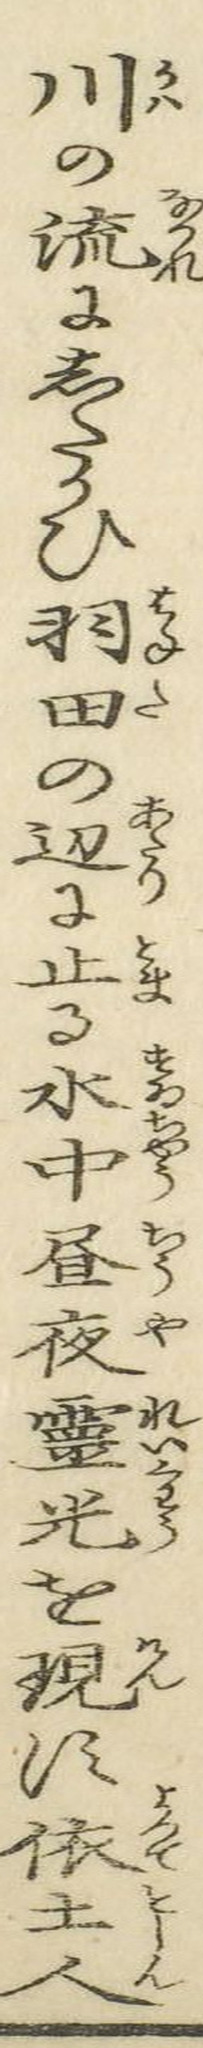川の流にしたかひ羽田の辺に止る水中昼夜靈光を現す依土人
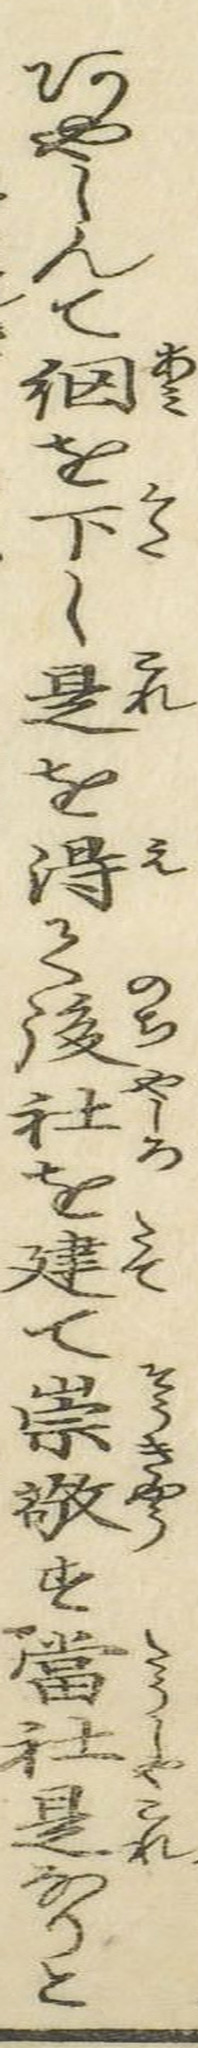あやしんて纲を下し是を得て後社を建て崇敬す當社是なりと
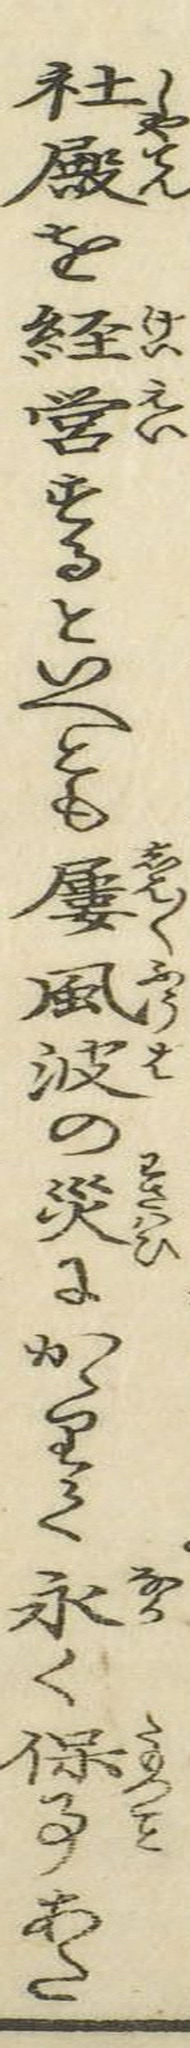社殿を経営するといへとも屢風波の災にかゝりて永く保事あた
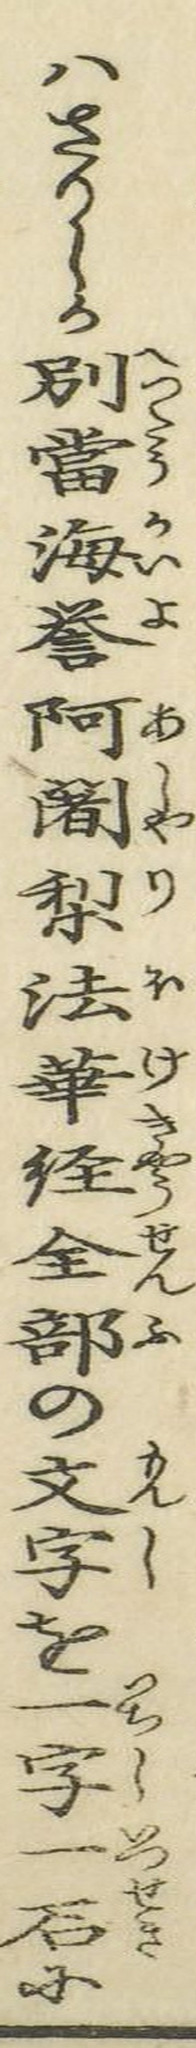はさりしか別當海誉阿闍梨法華経全部の文字を一字一石に
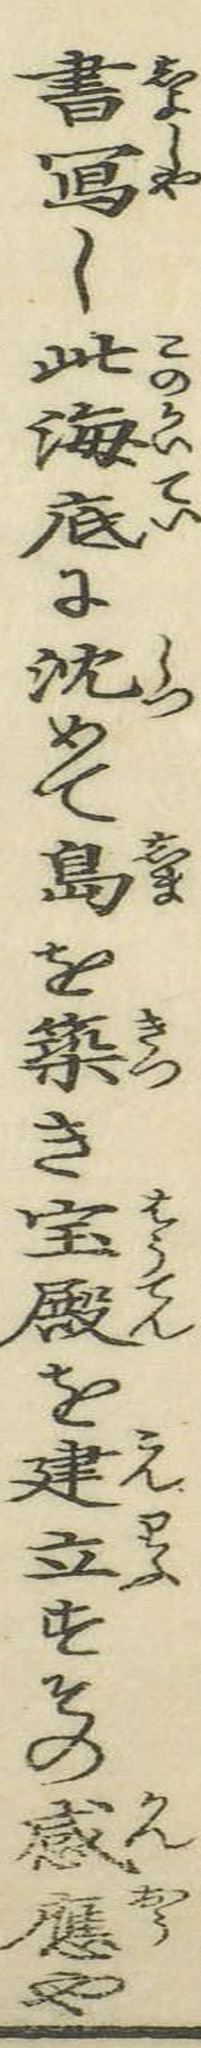書冩し此海底に沈めて島を築き宝殿を建立すその感應や
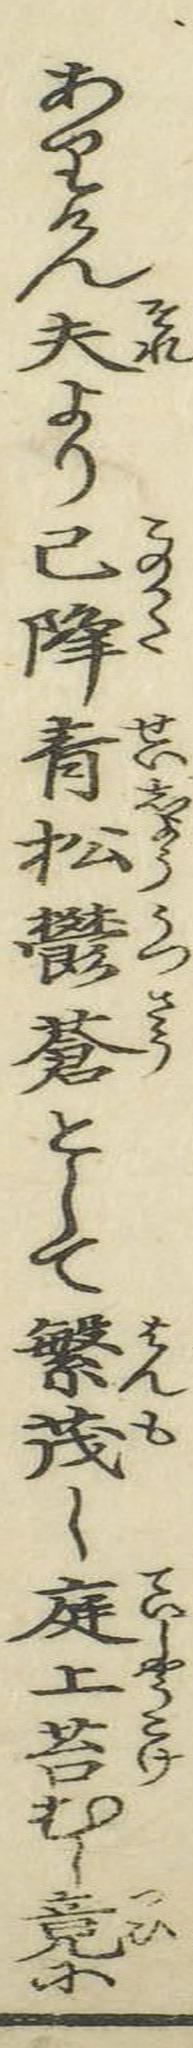ありけん夫より已降青松鬱蒼として繁茂し庭上苔むし竟に
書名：江戸名所図会 20巻 巻之4
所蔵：東京学芸大学教育コンテンツアーカイブ
